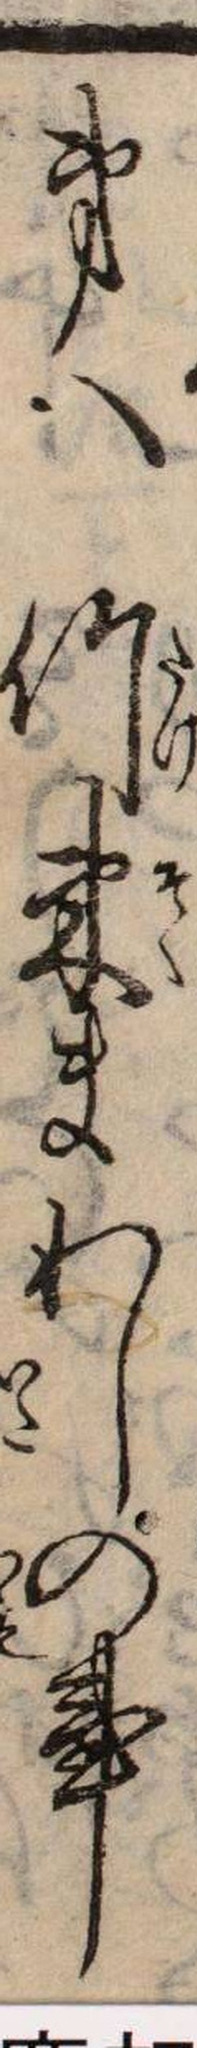第八竹束まわしの事
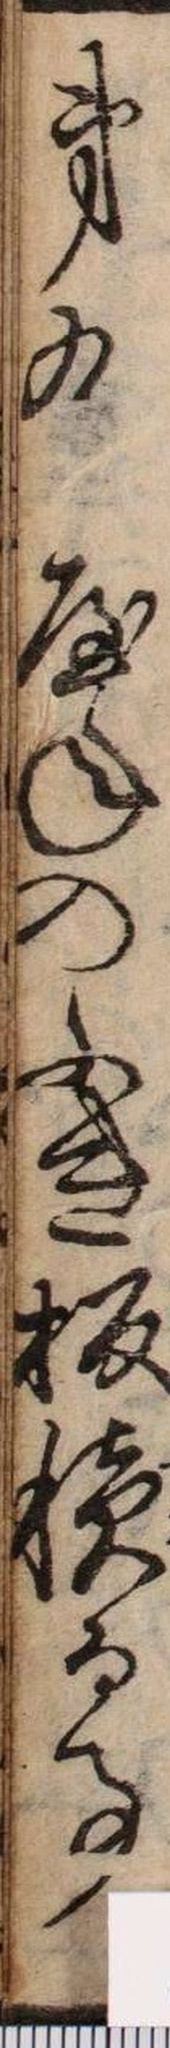第九やねのふき板積る事

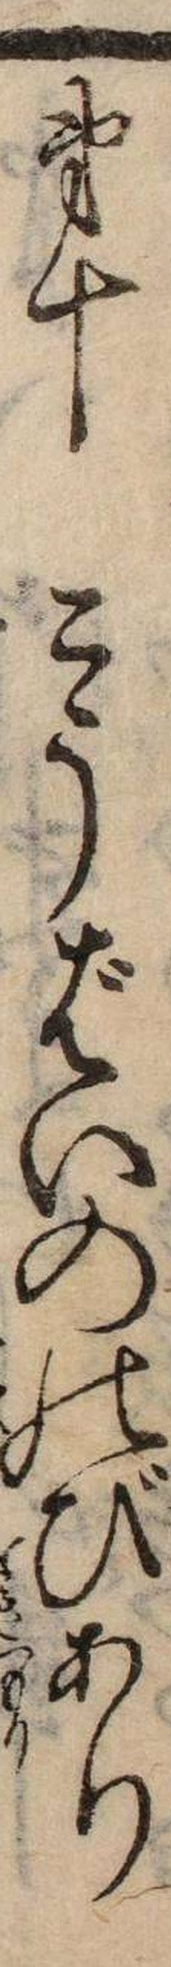第十こうばいののびあり
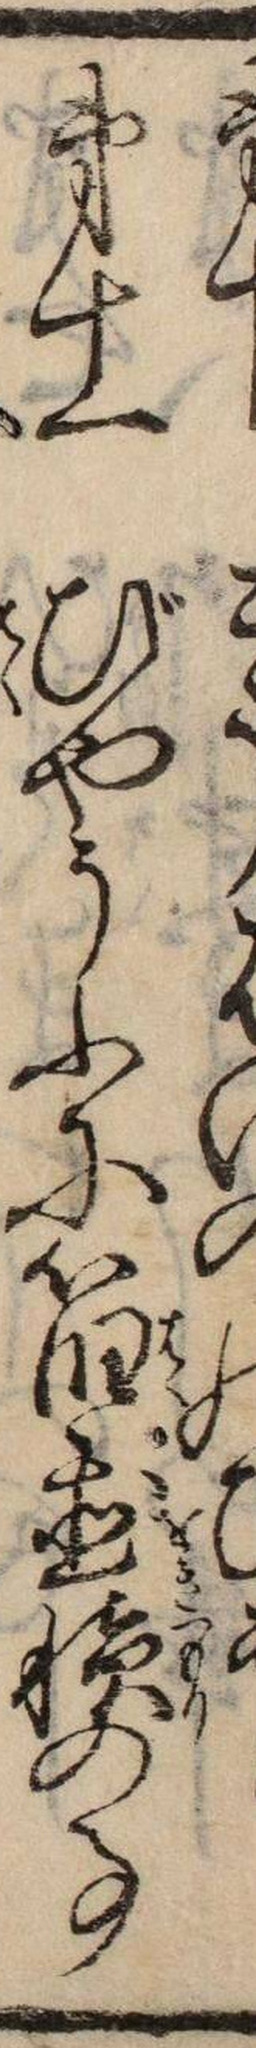第十一びやうふに箔置積の事
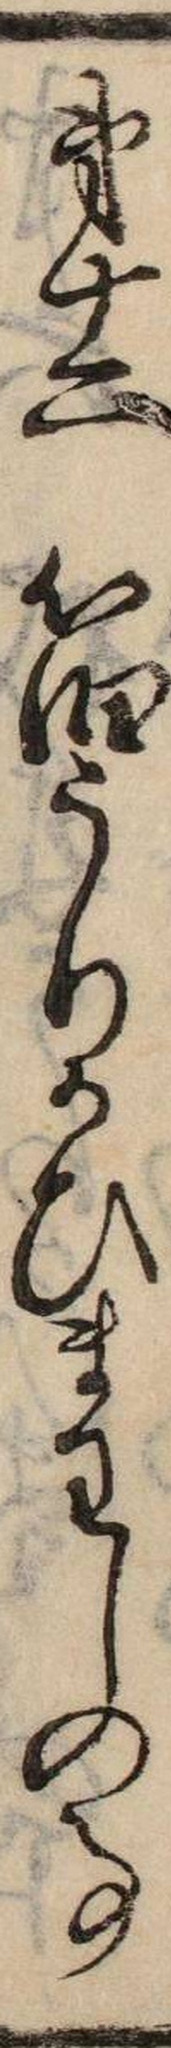第十二箔うりかひまわしの事
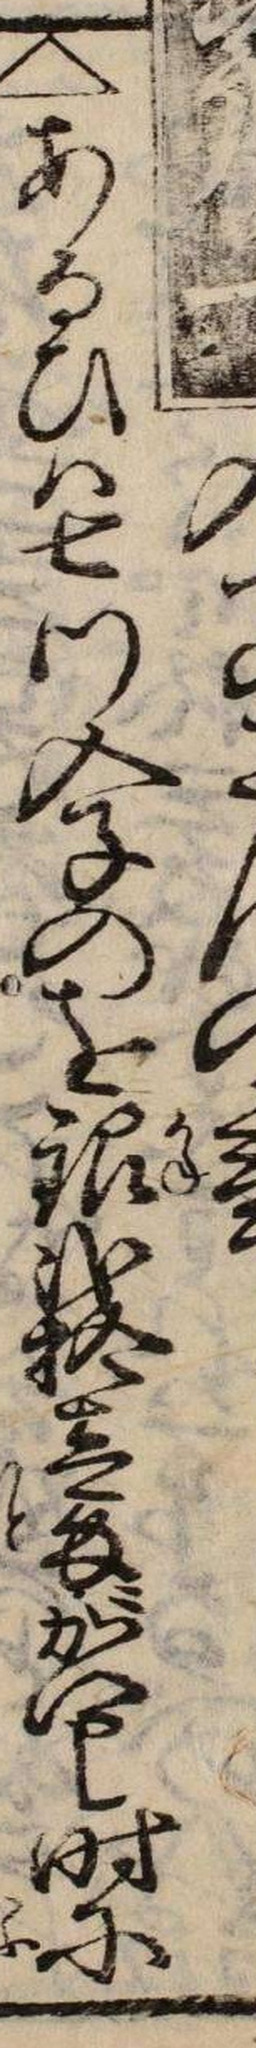△あるひは七つ入子のを銀弐拾壱匁にかい申候時に
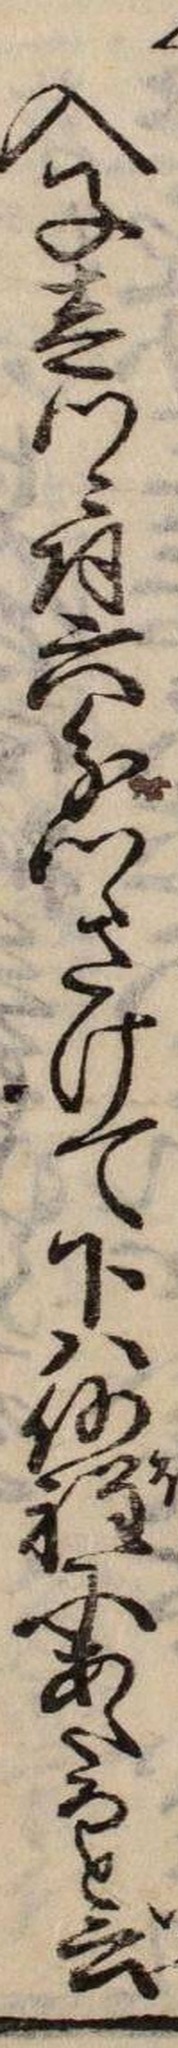入子壱つに付六分つさけて下は何程にあたると云
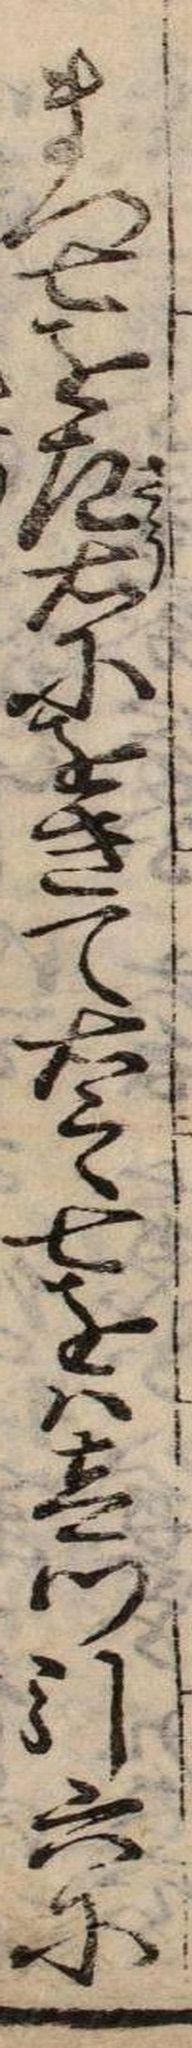まつ七を左右にをきて右之七をは壱つ引六に
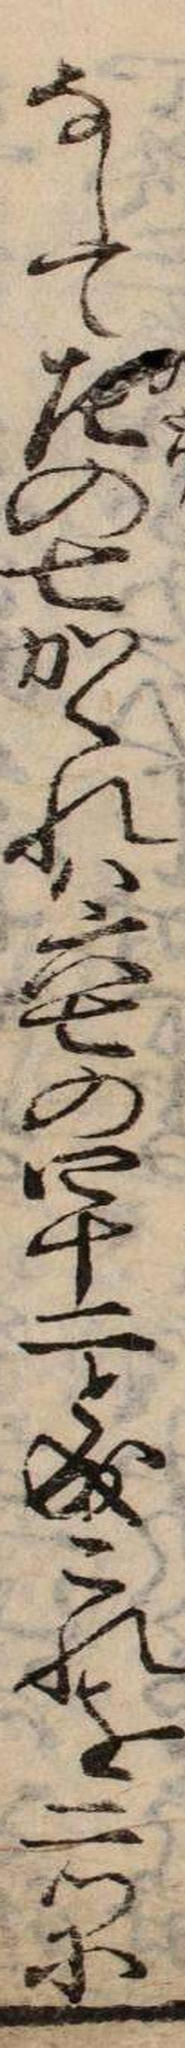なして左の七かくれは六七の四十二と成これを二つに
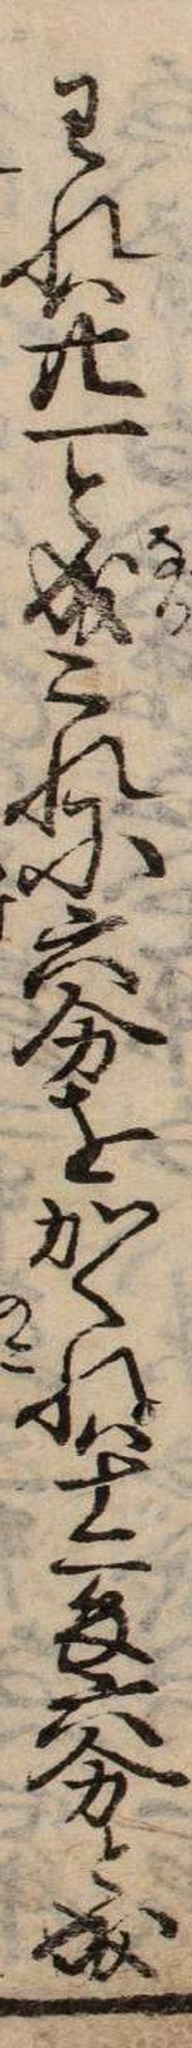われは廿一と成これに六分をかくれは十二反六分と成
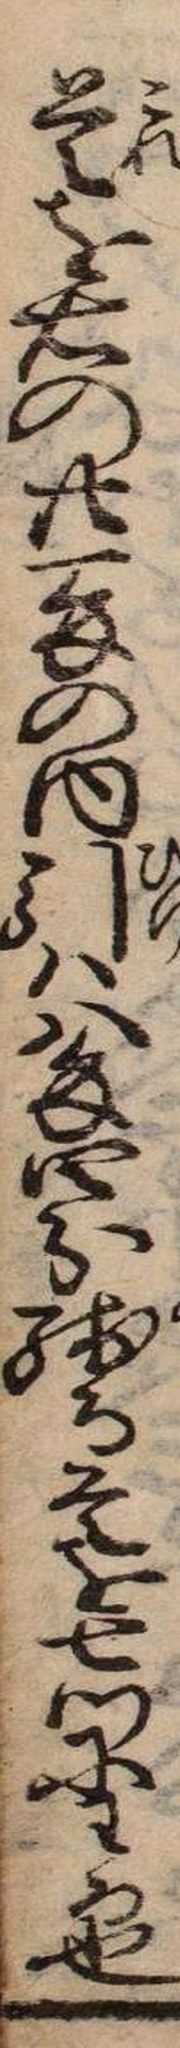是を右の廿一匁の内引は八匁四分残る是を七つにわる也

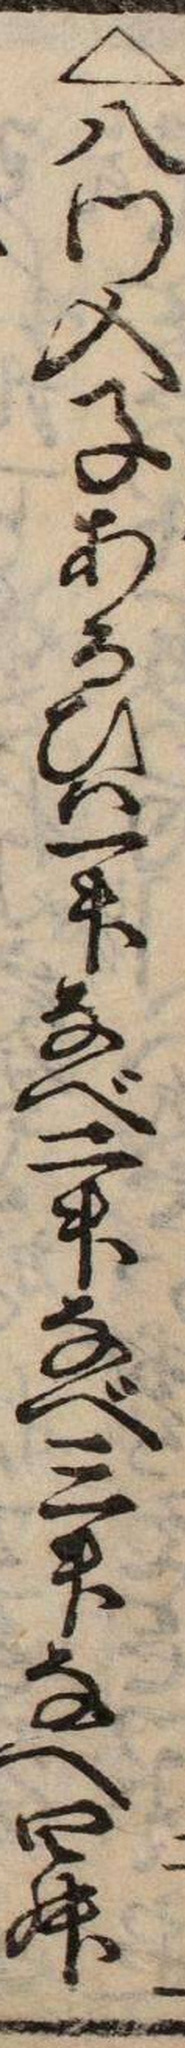△八つ入子あるひは一升なべ二升なべ三升なへ四升
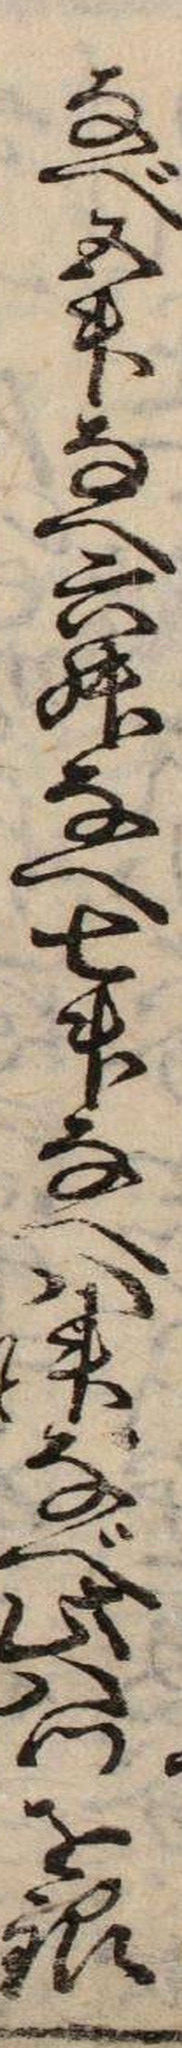なべ五升なへ六升なへ七升なへ八升なべ此八つを銀
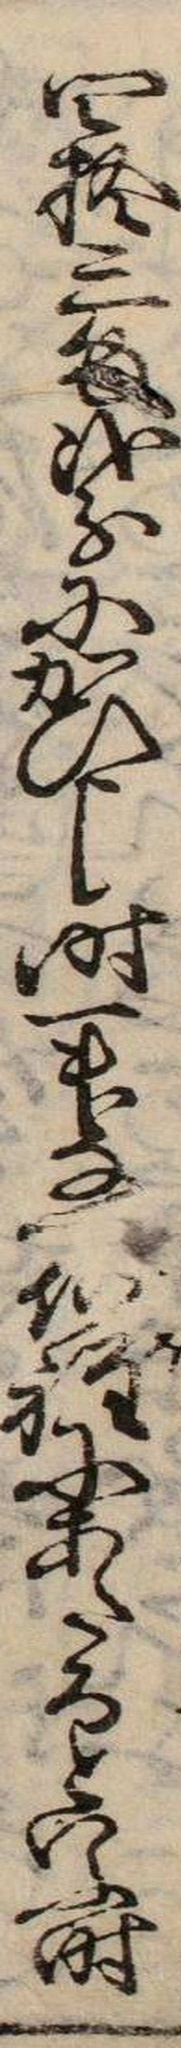四拾三匁弐分にかひ申候時一升なへ何程にあたるといふ時
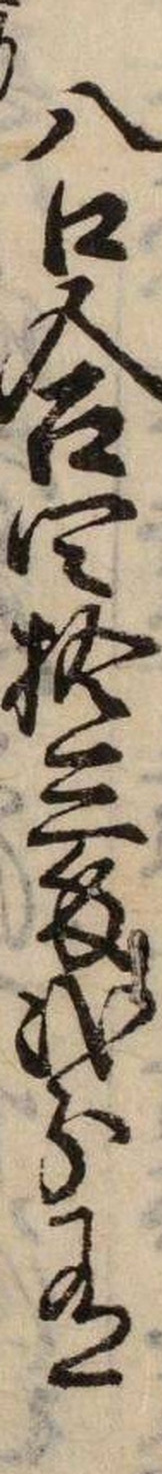八口合四拾三匁弐分有
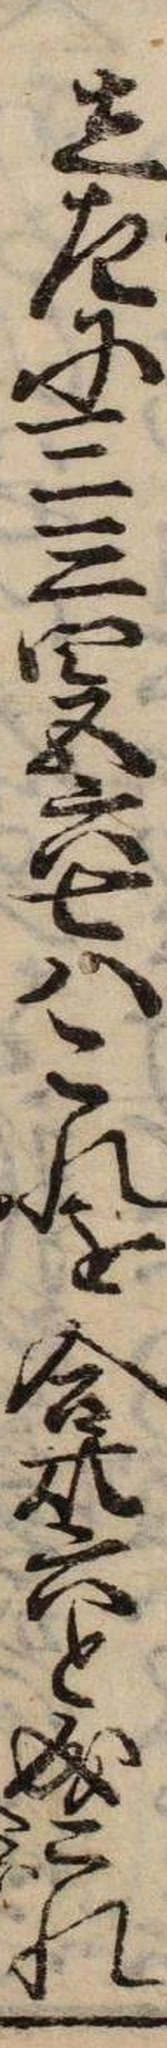先左に三三四五六七八これを合卅六と成これ
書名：塵劫記（寛永11年自跋、京都府立京都学・歴彩館追貴8）
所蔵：京都府立京都学・歴彩館 国文学研究資料館
